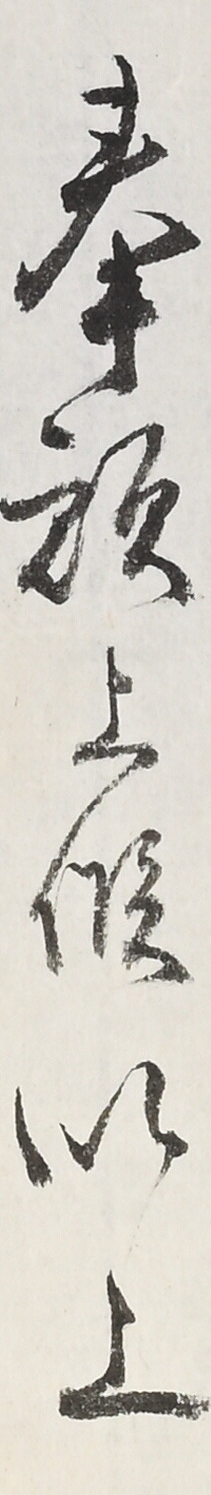奉願上候以上
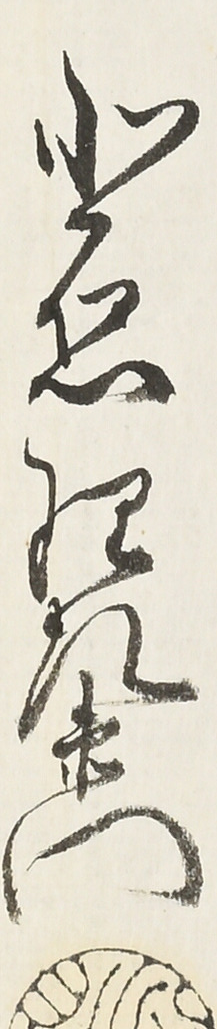北原理左衛門㊞
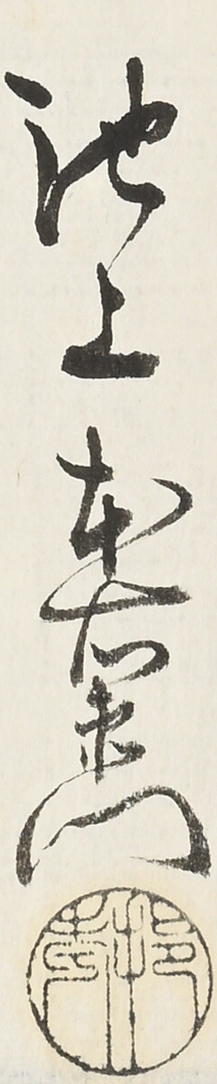池上本右衛門㊞
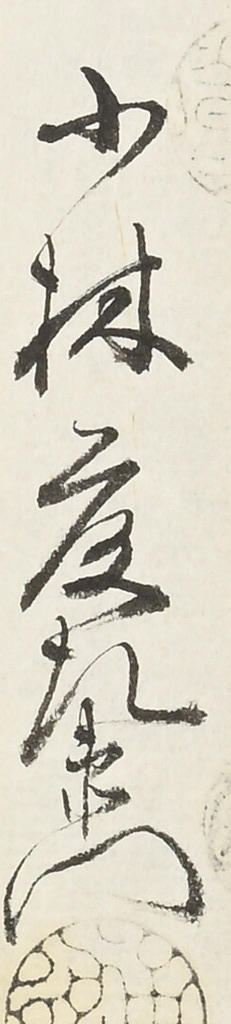小林藤左衛門㊞
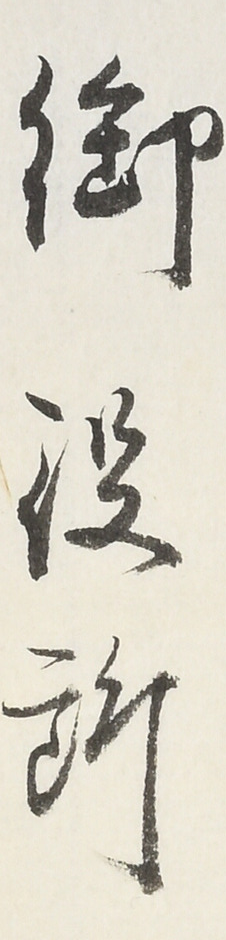御役所
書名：為取替一札之事
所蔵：伊那市立高遠町図書館・合同会社AMANE
